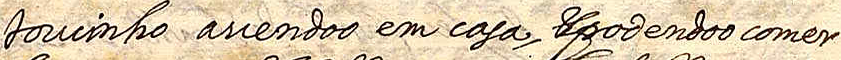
toucinho auendoo em casa, & podendoo comer
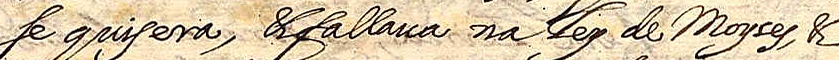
se quisera, & fallaua na Ley de Moyses, &
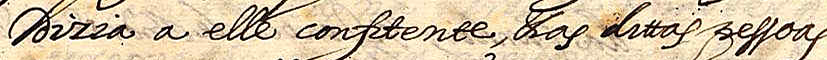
dizia a elle confitente, & as dittas pessoas
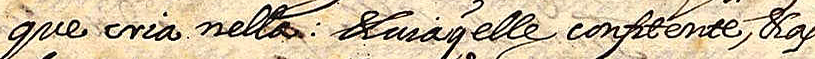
que cria nella : & uia q̄ elle confitente, & as
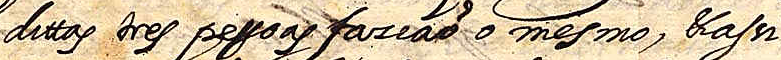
dittas tres pessoas faziaõ o mesmo, & assi
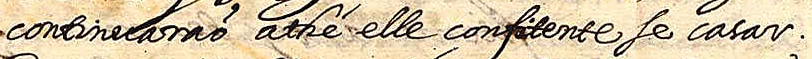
continuaraõ athé elle confitente se casar.
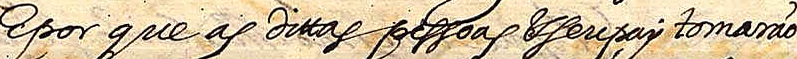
E porque as dittas pessoas & seu pay tomaraõ
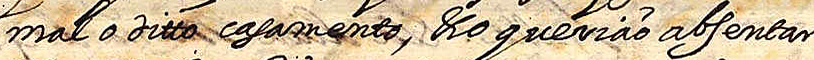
mal o ditto casamento, & o queriaõ absentar
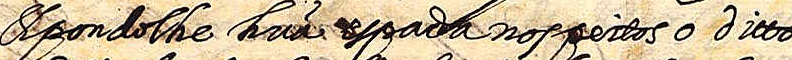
& pondolhe huā espada nos peitos o ditto
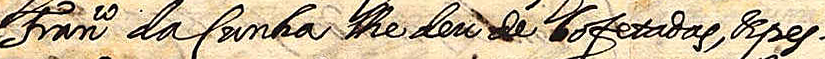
Franco da Cunha lhe deu de bofetadas, & pes
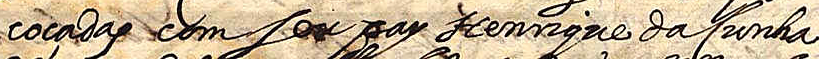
coçadas com seu pay Henrique da Cunha
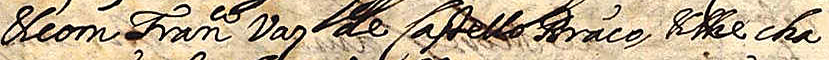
& com Franco Vaz de Castello Brāco, & lhe cha
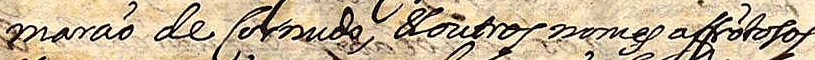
maraõ de Cornudo, & outros nomes affrōtosos
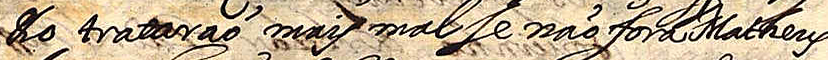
& o trataraõ mais mal se naõ fora Matheus
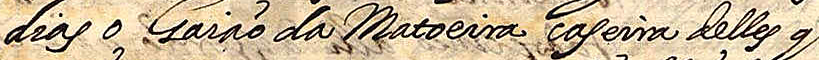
dias o Gaiaõ da Matoeira caseira delles q̄
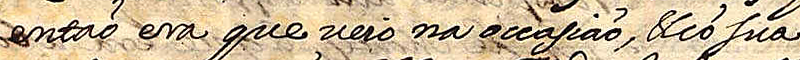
entaõ era que ueio na occasiaõ, & cō sua
